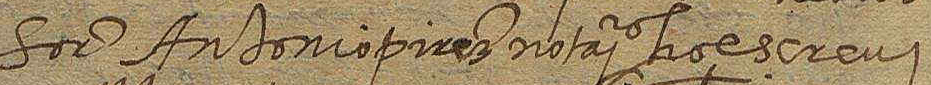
sor̄ Antonio pirez̄ notajro ho escreuj
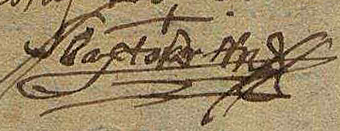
baltasar ffrz
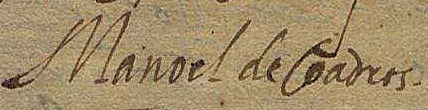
Manoel de Coadros
